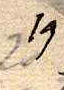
19
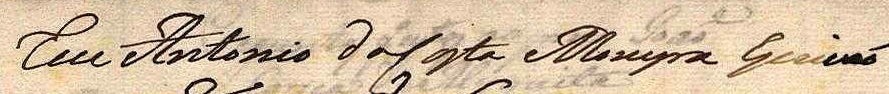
E eu Antonio da Costa Moreyra Gauuaõ
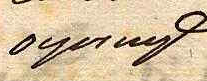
o escreuj
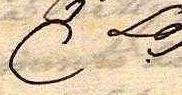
CL.os
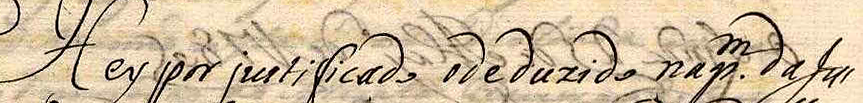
Hey por justificado o deduzido na p.m da Jus
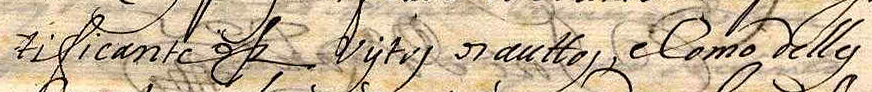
tificante a ̄ vistos os auttos e Como delles
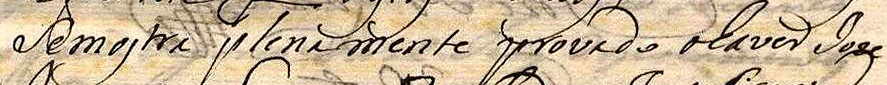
Se mostra plenamente provado o haver Ioze
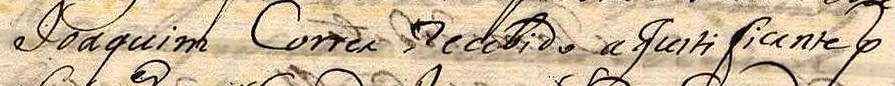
Ioaquim Correa Recebido a Justificante p̄
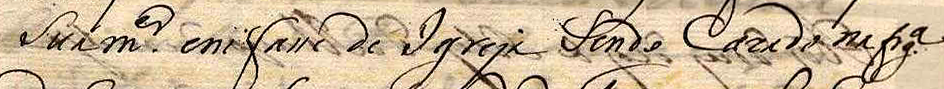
sua mer. em fasse de Igreja sendo Cazado na frg.a
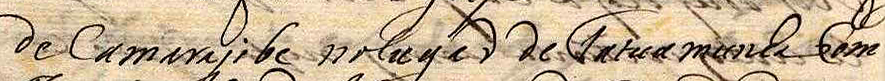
de Camaragibe no lugar de Tatuamunha Com
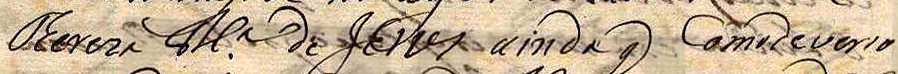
Thereza M.a de JEsVs ainda q̄ Com o deverso
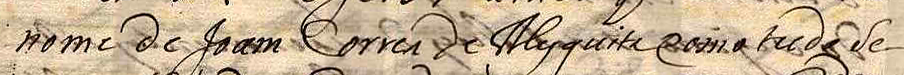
nome de Joam Correa de Mesquita como tudo se
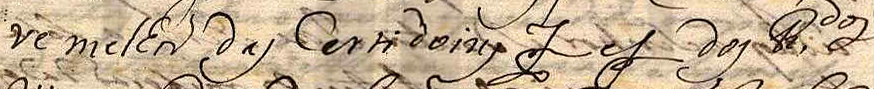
ve melhor das Certidoins f̄ e f̄ dos R.dos
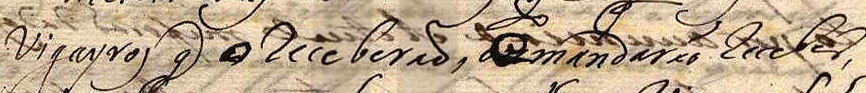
Vigayros q̄ o Receberaõ, E mandaraõ Receber,
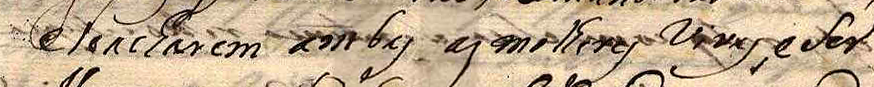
e se acharem ambas as molheres vivas, e ser
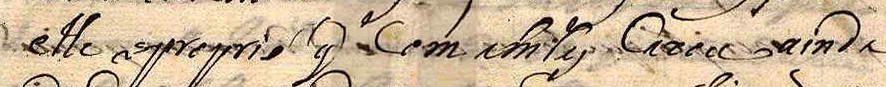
elle o proprio q̄ Com ambas Cazou ainda
